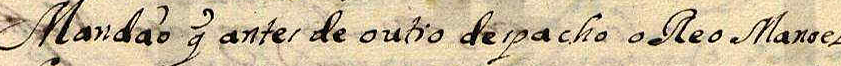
Mandaõ q̄ antes de outro despacho o Reo Manoel
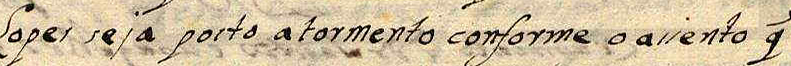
Lopes seja posto a tormento conforme o assento q̄
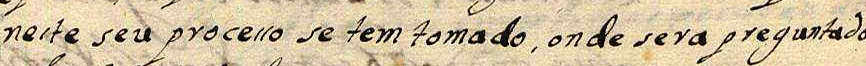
neste seu processo se tem tomado, onde sera preguntado
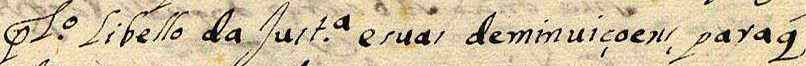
pl.o libello da Just.a e suas deminuiçoens, para q̄
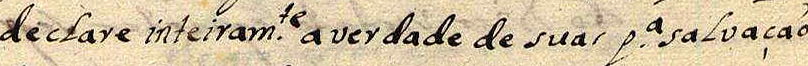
declare inteiram.te a verdade de suas p.a salvaçaõ
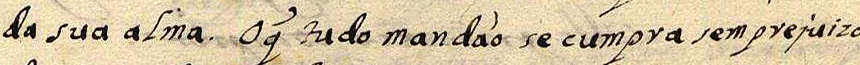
da sua alma. O q̄ tudo mandaõ se cumpra sem prejuizo
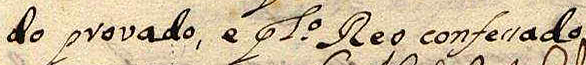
do provado, e pl.o Reo confessado.
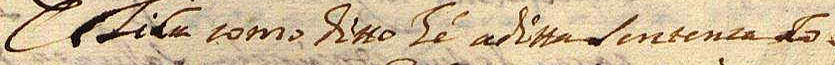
E lida como ditto hé a ditta sentença do
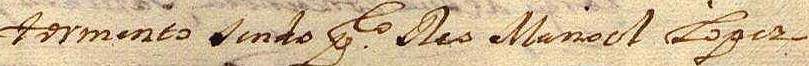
tormento sendo p.lo Reo Manoel Lopez
